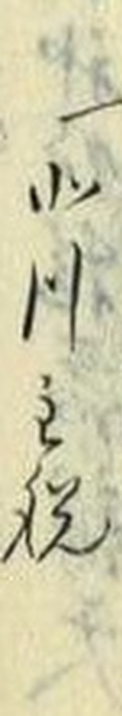北川主税
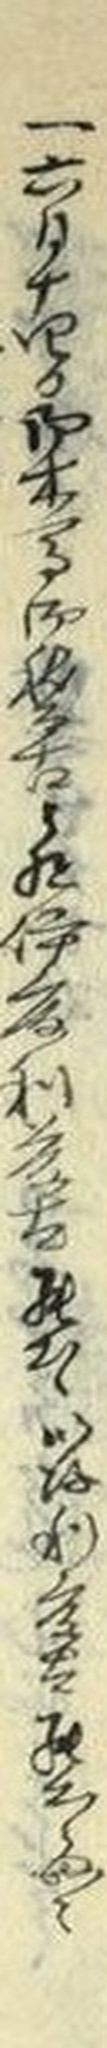一六月十四日御木馬御稽古被遊伊藤利藤太罷出候以後利藤太罷出候毎々
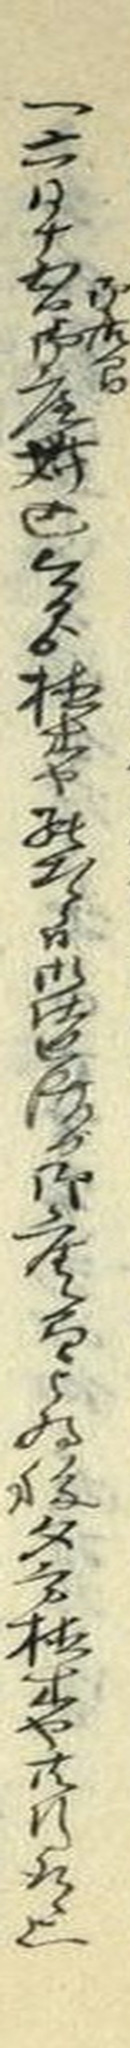一六月十五日御居間御庭苅込今日ゟ植木や罷出候ニ付御仕廻済ゟ御座之間へ被為移夕方植木や共引取候上
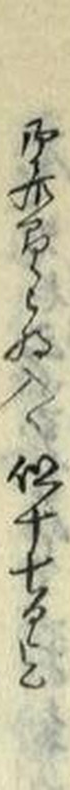御居間へ被為入候但十七日迄
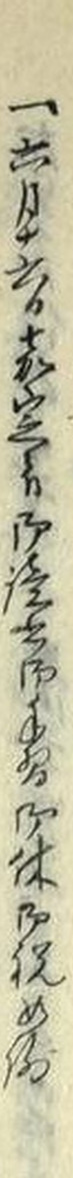一六月十六日嘉定ニ付御読書御手習御休御祝如例
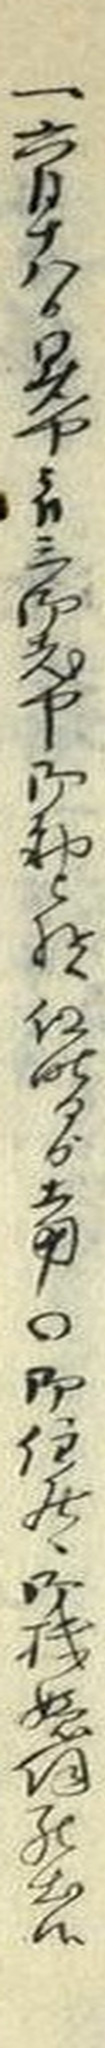一六月十八日暑中ニ付三御老中御勤被遊候但昨日ゟ土用〇御住居へ御機嫌伺罷出候
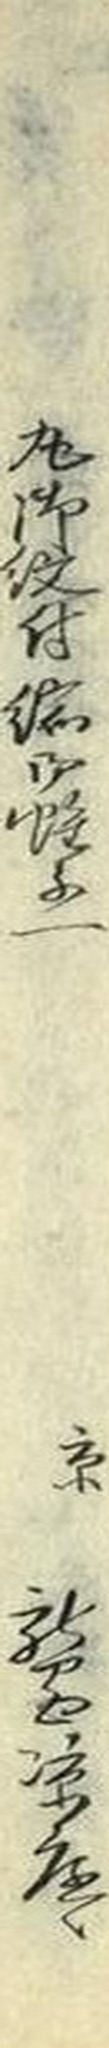丸御紋付縮御帷子一京新宮涼庭へ
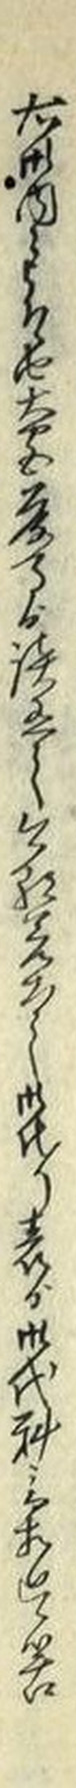右御内々被下候由大宮藤馬ゟ談有之今朝差出之御代り表ゟ御代料ニ而相廻候筈
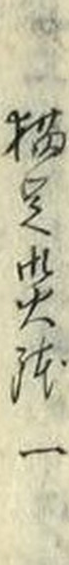猫足御火鉢一
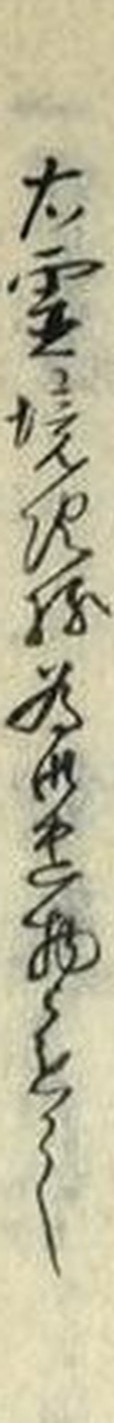右霊境院様為御遺物被進之
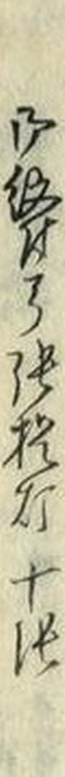御紋付弓張提灯十張
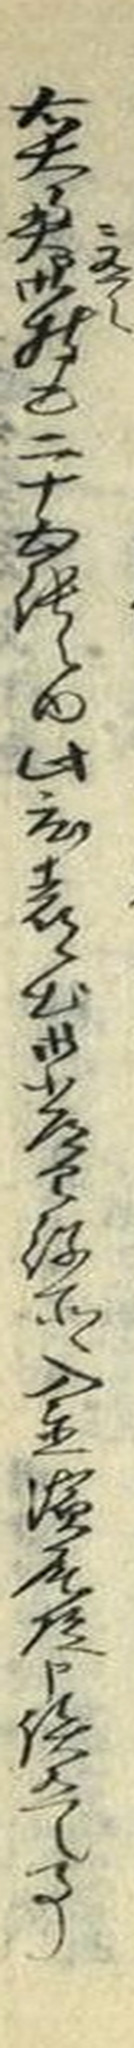右大奥ニ有之御持込二十五張之内此度表へ出御小道具役所へ入置浜尾殿申談有之事
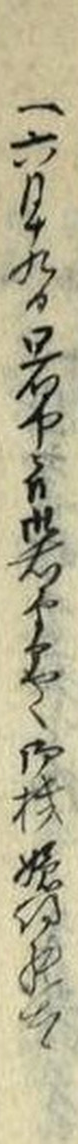一六月十九日暑中ニ付御右筆部屋へ御機嫌伺罷出候

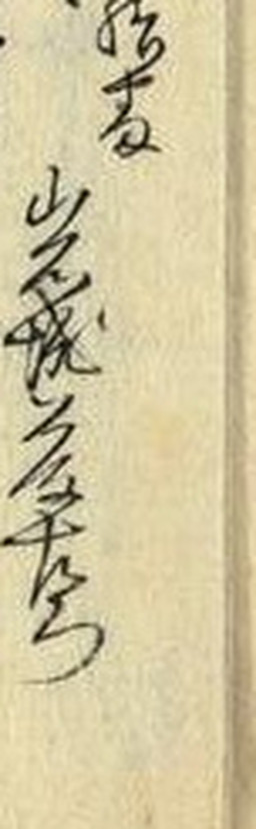其段岩城藤左衛門
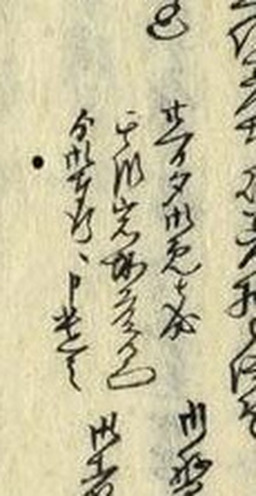其段岩城藤左衛門
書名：少傅日録抄（斉善付側向頭取日記、在府）
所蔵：福井県文書館 Fukui Prefectural Archives
